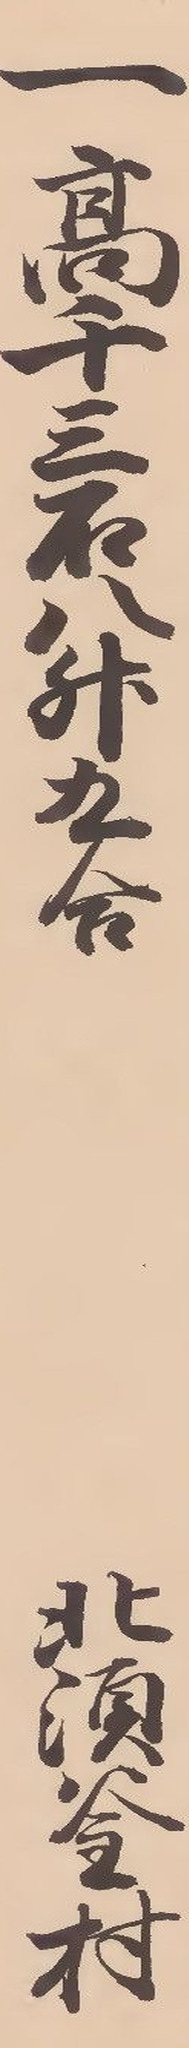一高千三石八升九合北須釜村
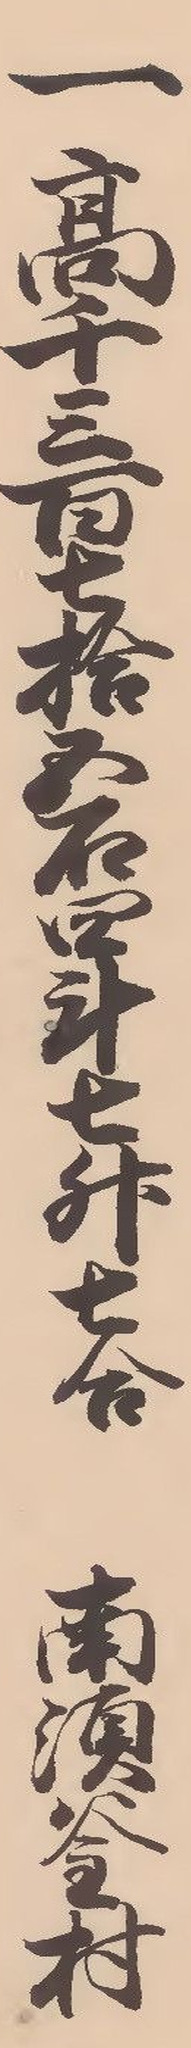一高千三百七拾五石四斗七升七合南須釜村
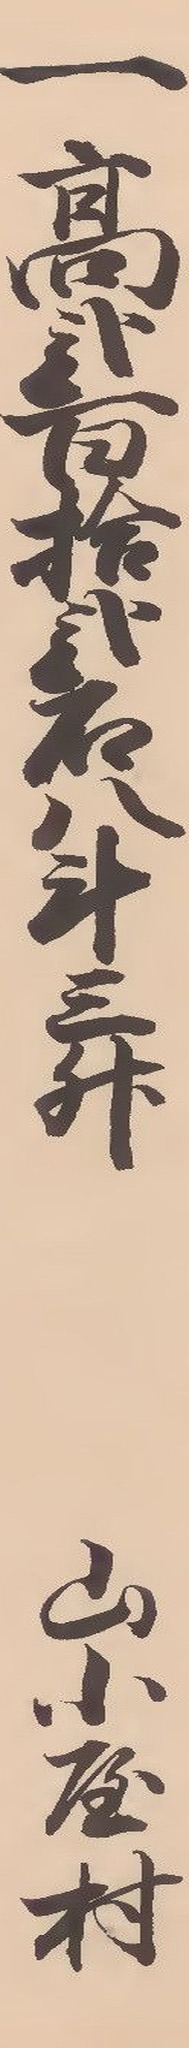一高弐百拾弐石八斗三升山小屋村
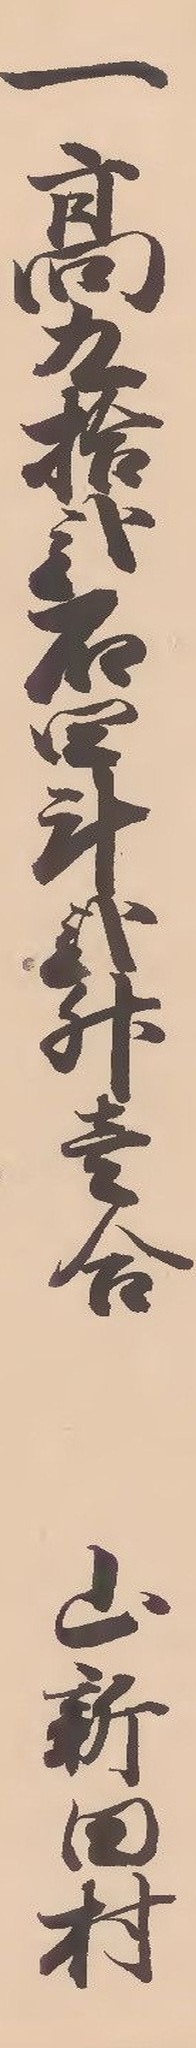一高九拾弐石四斗弐升壱合山新田村

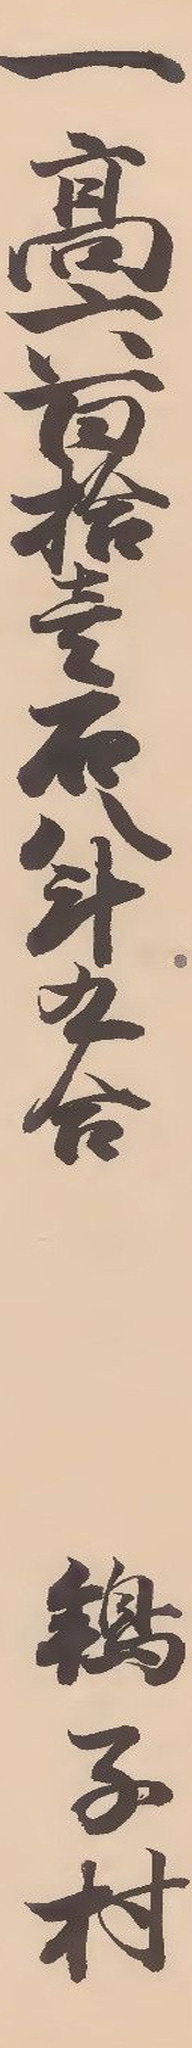一高六百拾壱石八斗九合鴾子村
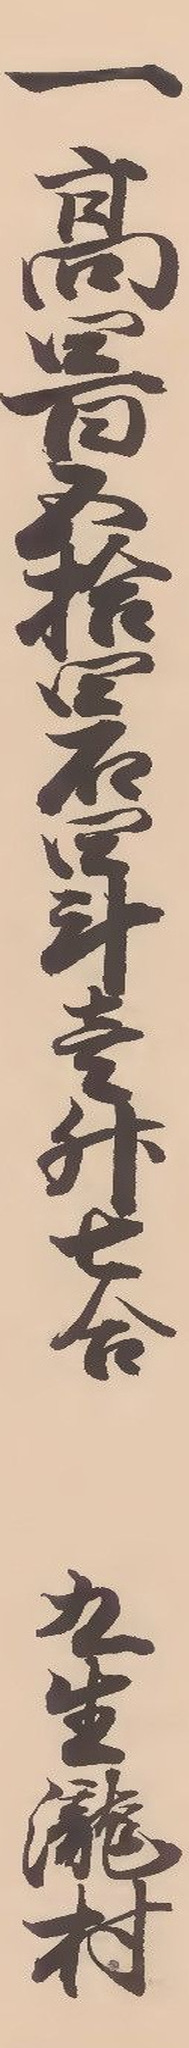一高四百五拾四石四斗壱升七合九生滝村
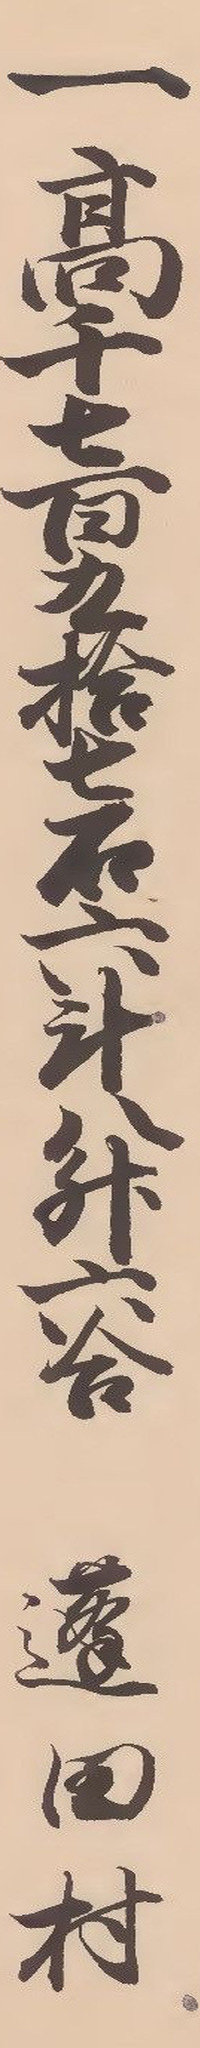一高千七百九拾七石六斗八升六合蓮田村
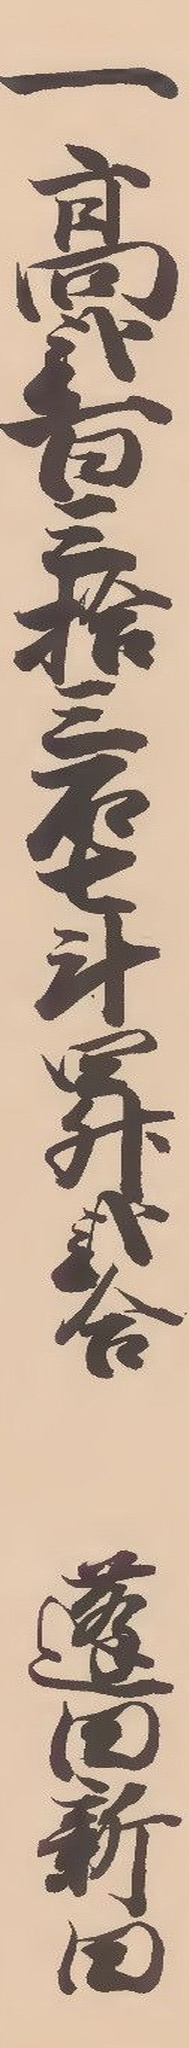一高弐百三拾三石七斗四升弐合蓬田新田
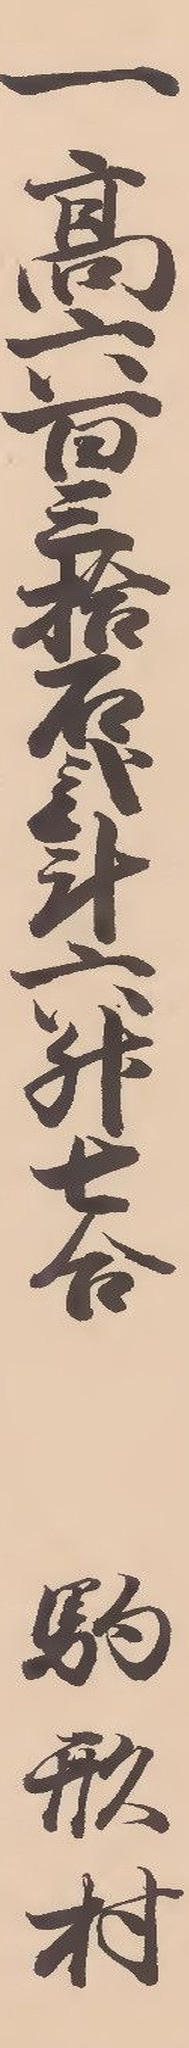一高六百三拾石弐斗六升七合駒形村
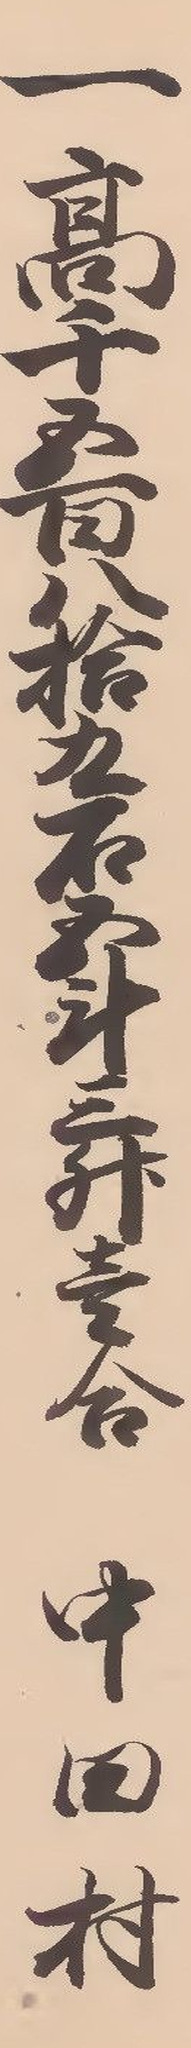一高千五百八拾九石五斗三升壱合中田村
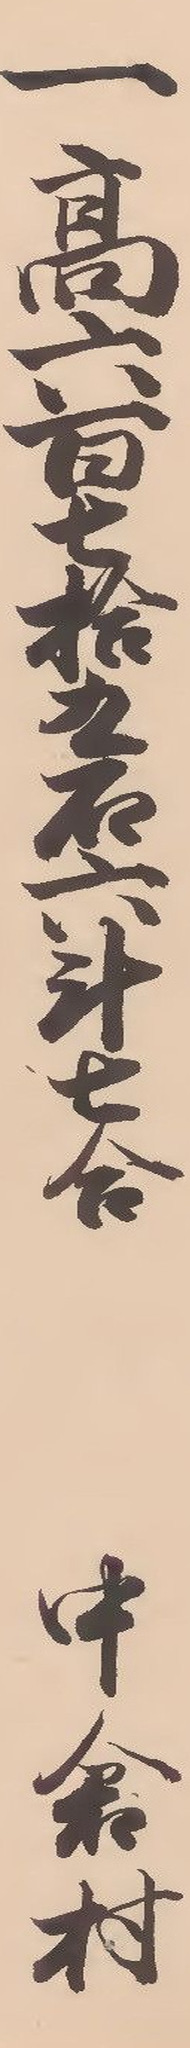一高六百七拾九石六斗七合中倉村
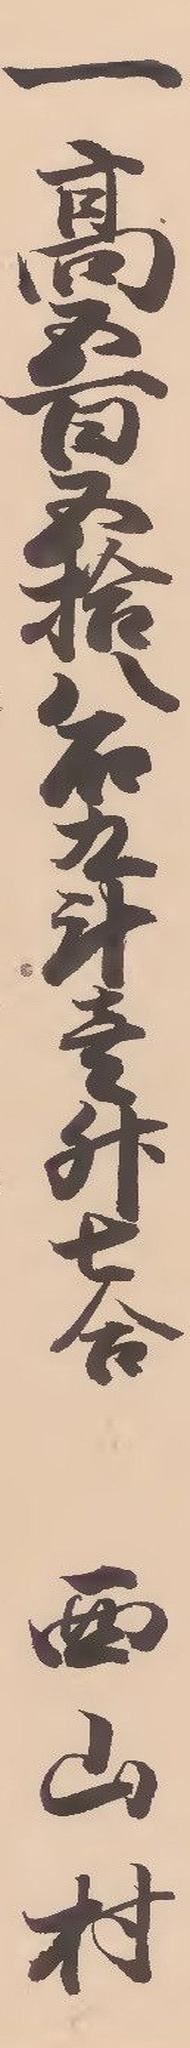一高五百五拾八石九斗壱升七合西山村

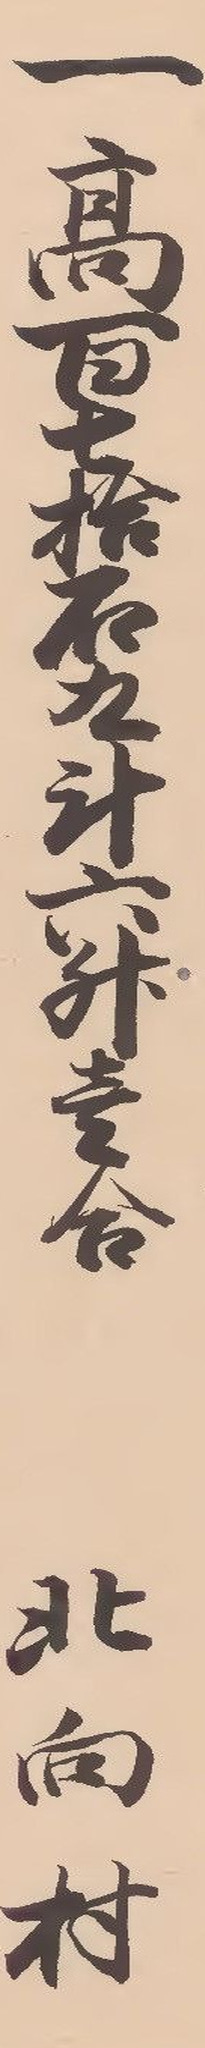一高百七拾石九斗六升壱合北向村
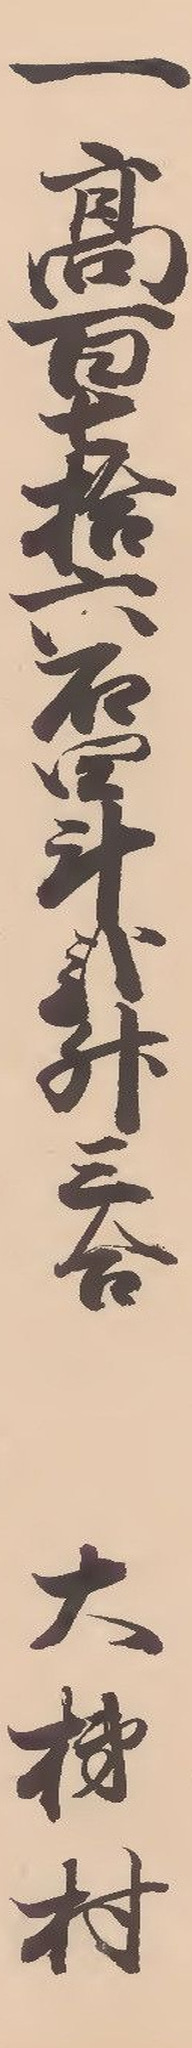一高百七拾六石四斗弐升三合大柿村
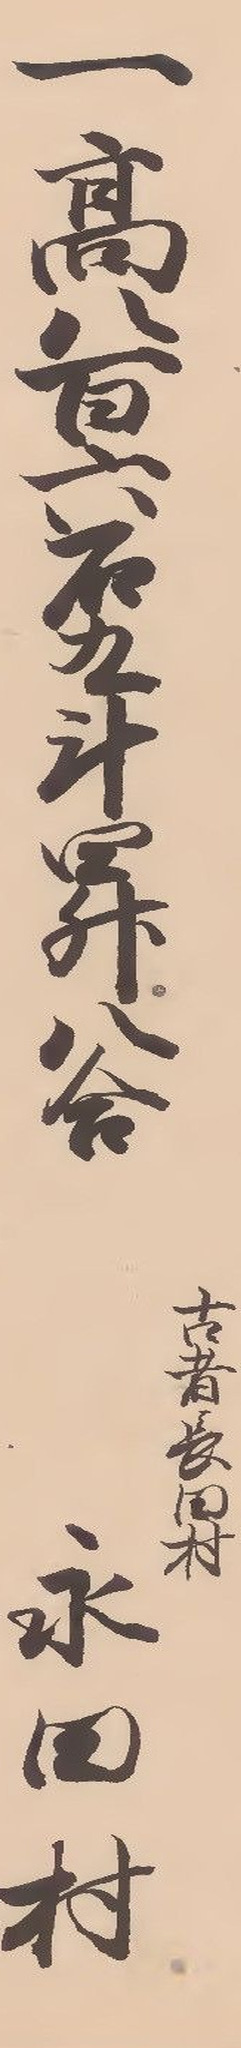一高八百六石九斗四升八合永田村
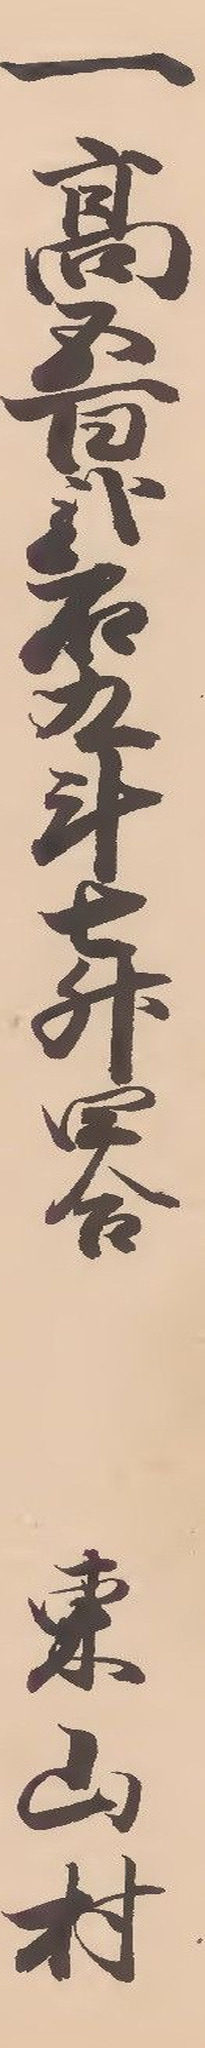一高五百弐石九斗七升四合東山村
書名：陸奥国郷帳　２
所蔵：国立公文書館 National Archives of Japan
